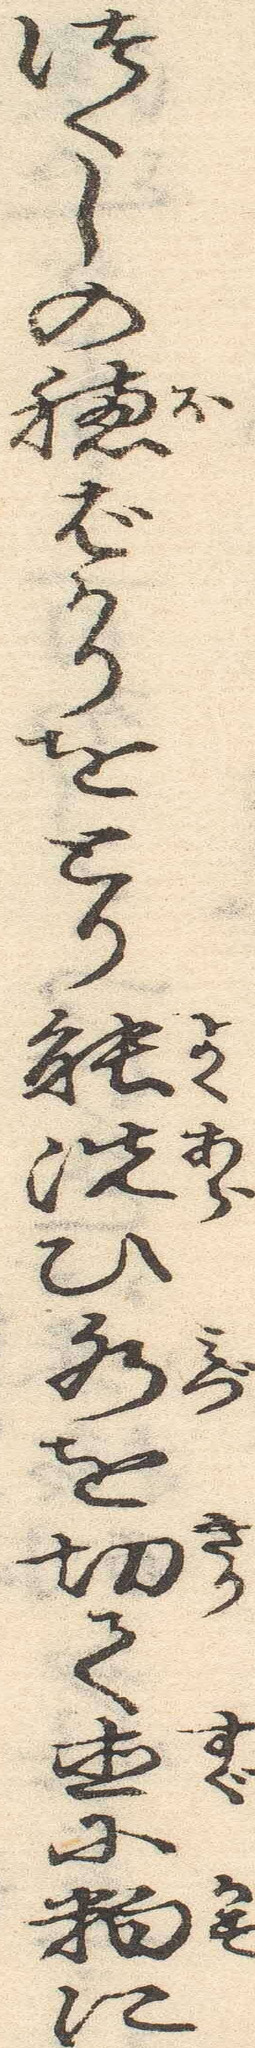つくしの穂ばかりをとり能洗ひ水を切て直に粕に
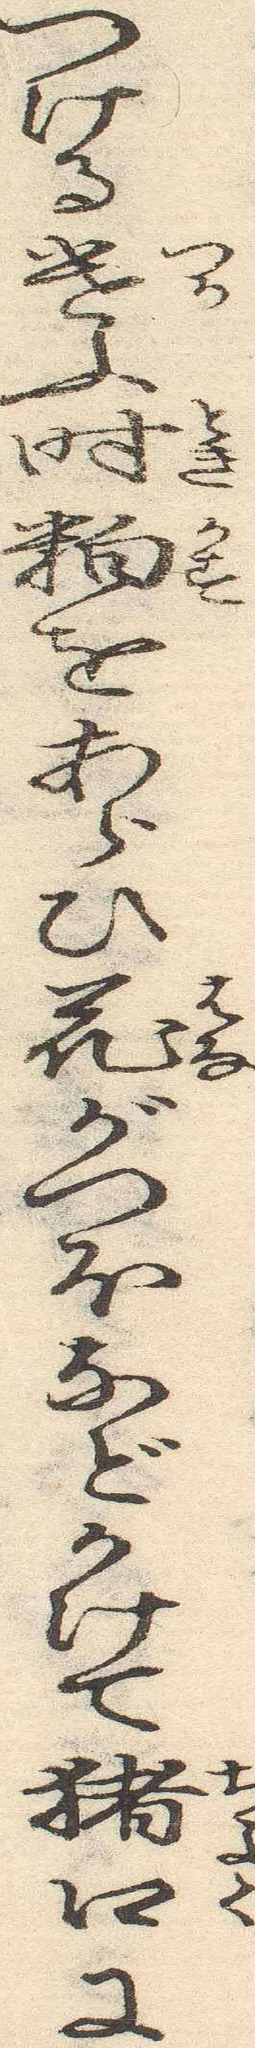つける遣ふ時粕をあらひ花がつほなどかけて猪口に
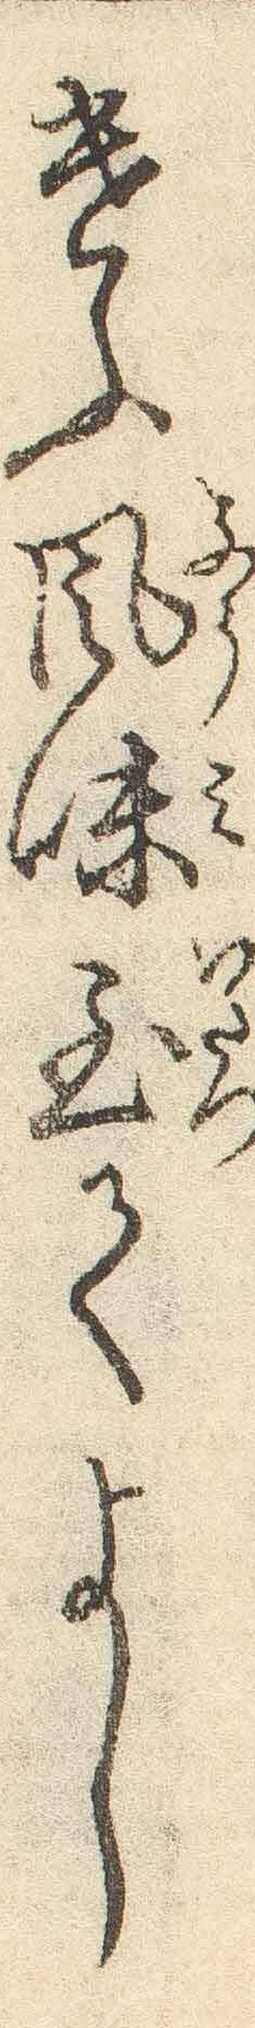遣ふ風味至てよし
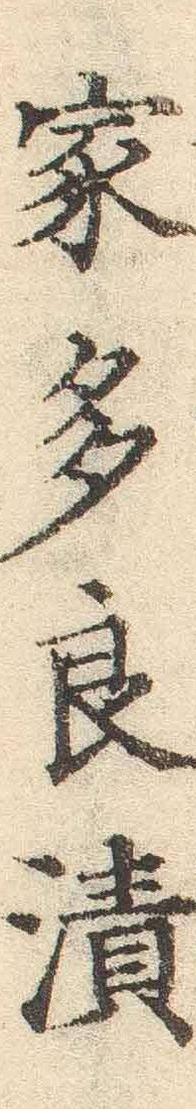家多良漬
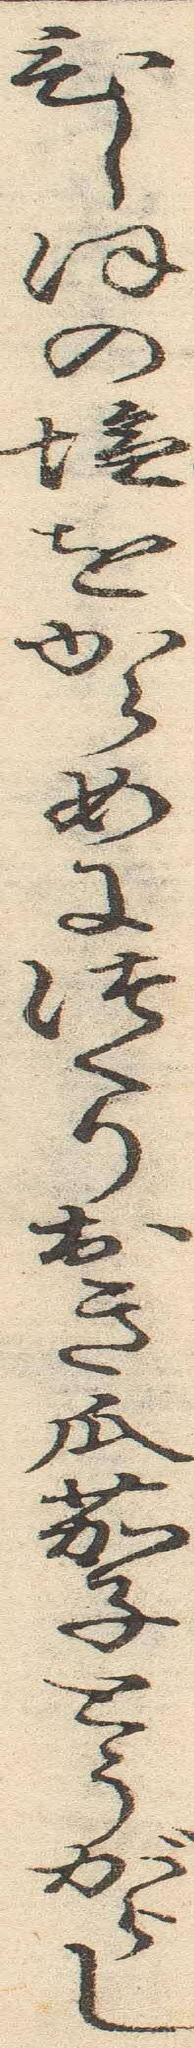ひしほの塩をからめにつくりおき瓜茄子とうがらし
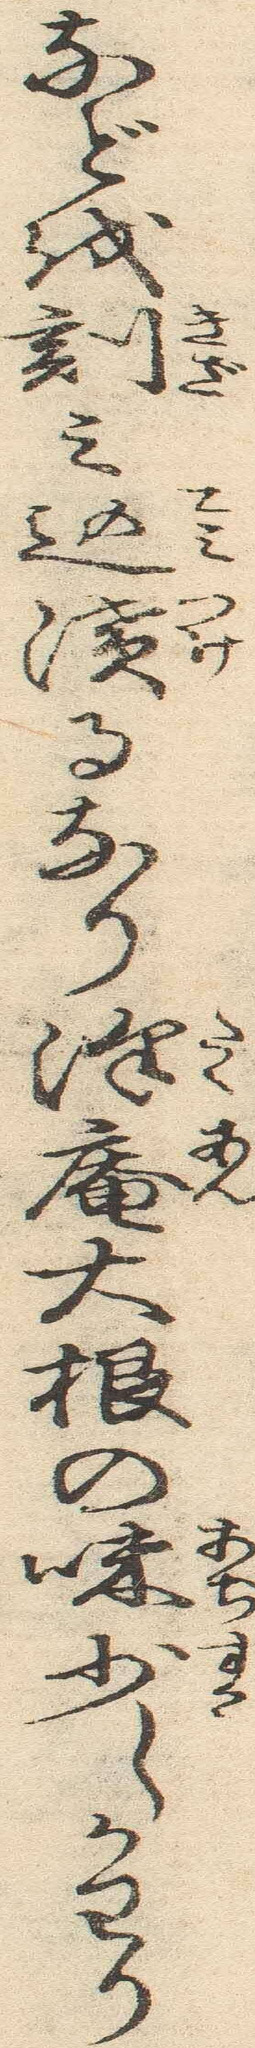などを刻み込漬るなり沢庵大根の味少しかわり

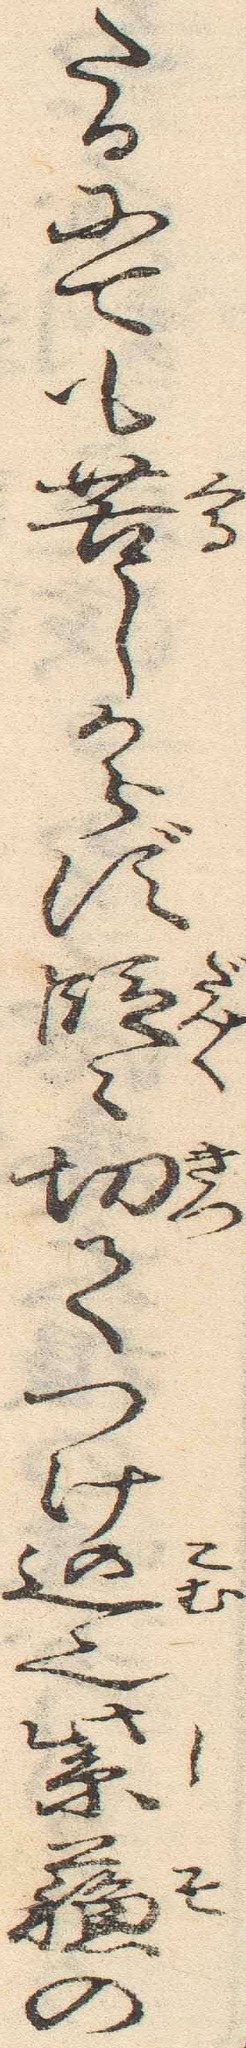たるにても苦しからず段々切てつけ込也紫蘇の
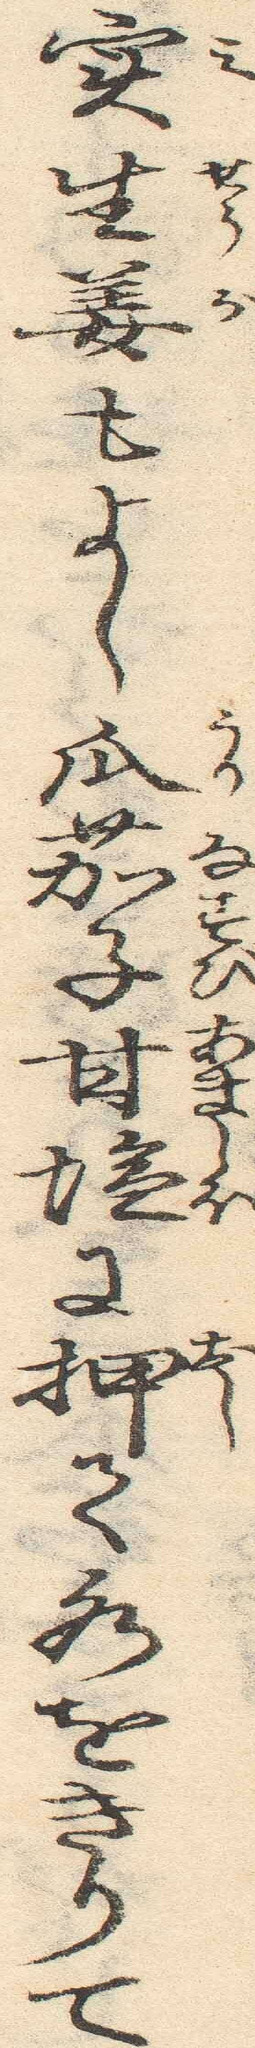実生姜もよし瓜茄子甘塩に押て水をきりて
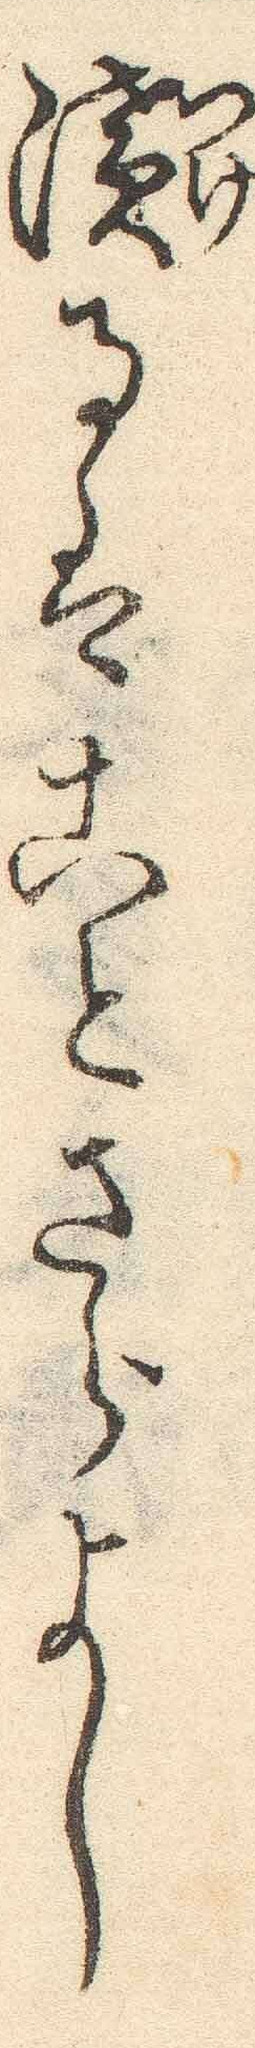漬るはことさらよし
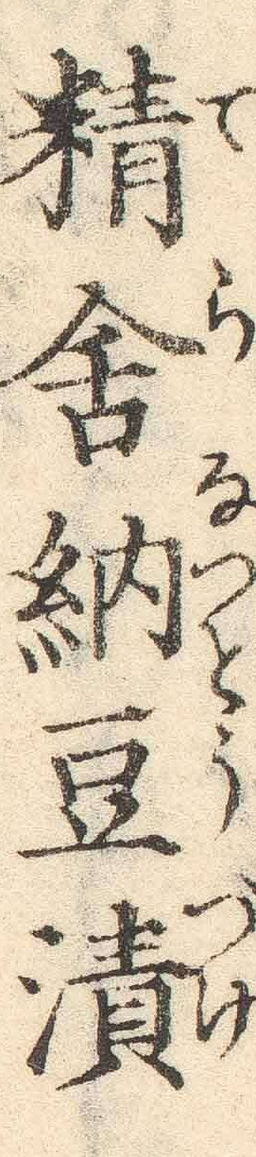精舎納豆漬
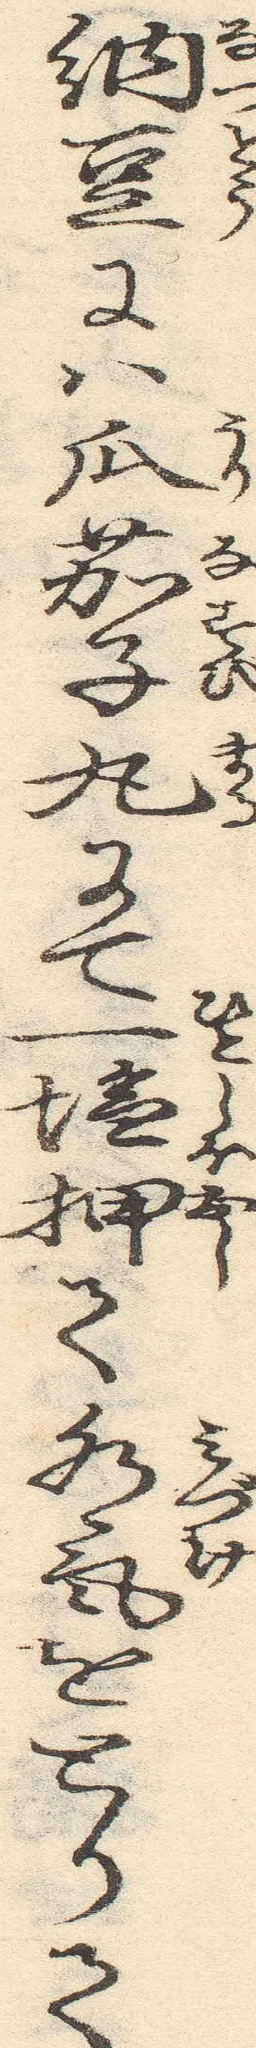納豆には瓜茄子丸にて一塩押て水気をとりて
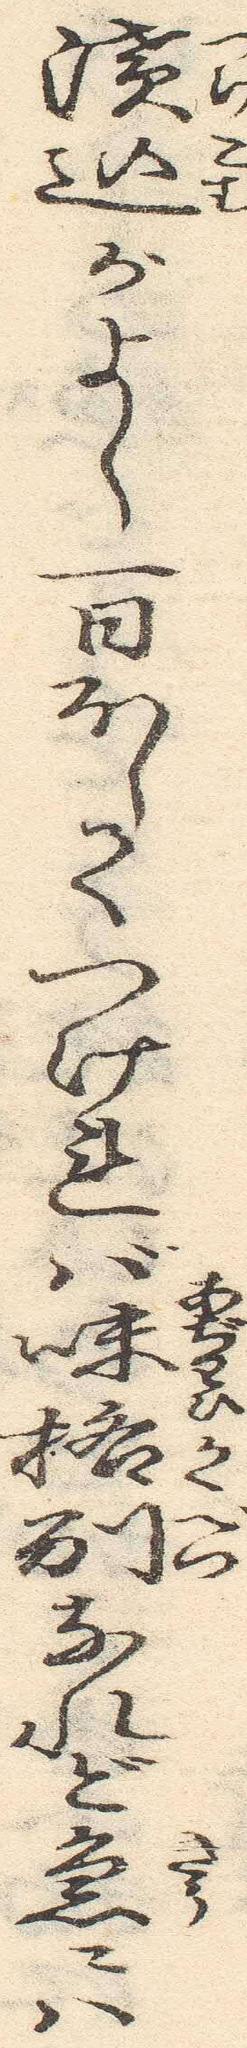漬込がよし一日ほしてつければ味格別なれど急には
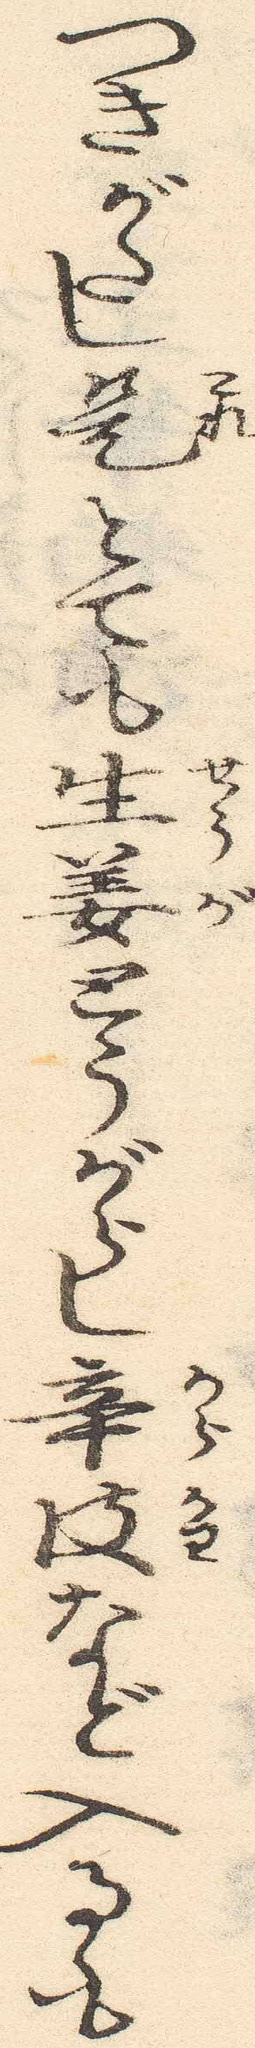つきがたし是とても生姜とうがらし辛皮など入るも
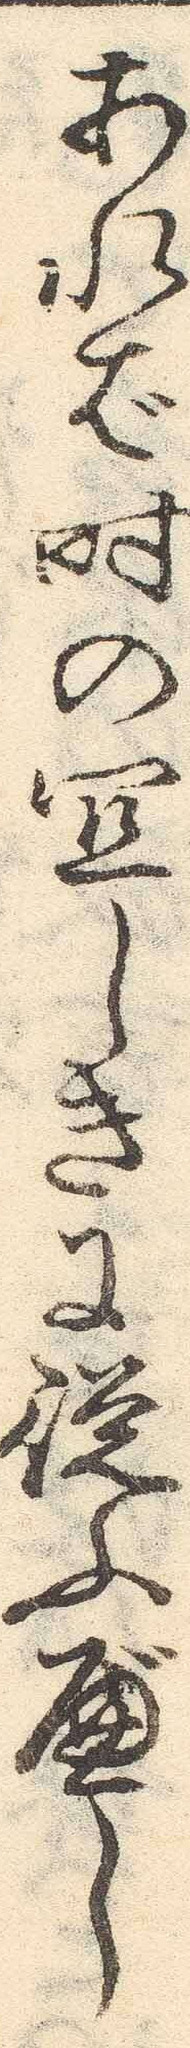あれば時の宜しきに従ふべし
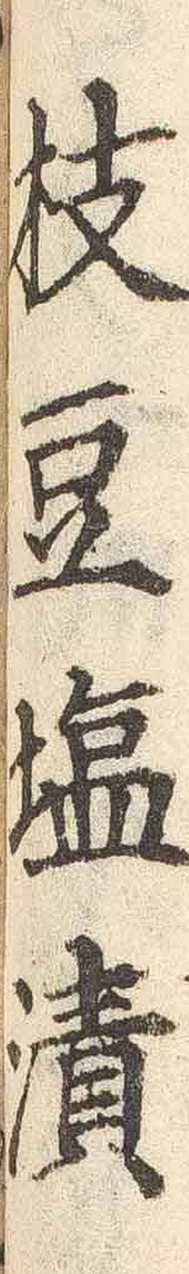枝豆塩漬
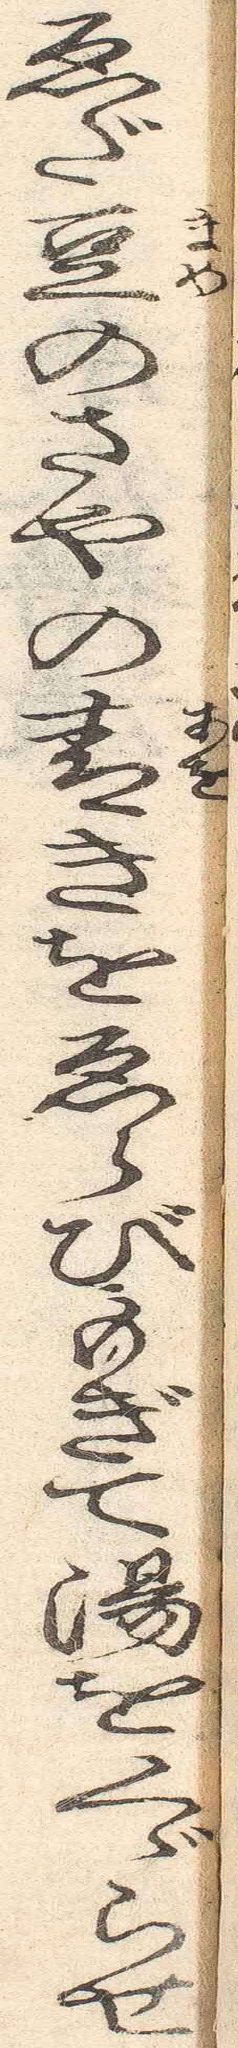ゑだ豆のさやの青きをゑらびもぎて湯をくゞらせ
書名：四季漬物塩嘉言
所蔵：東京学芸大学附属図書館 国文学研究資料館
